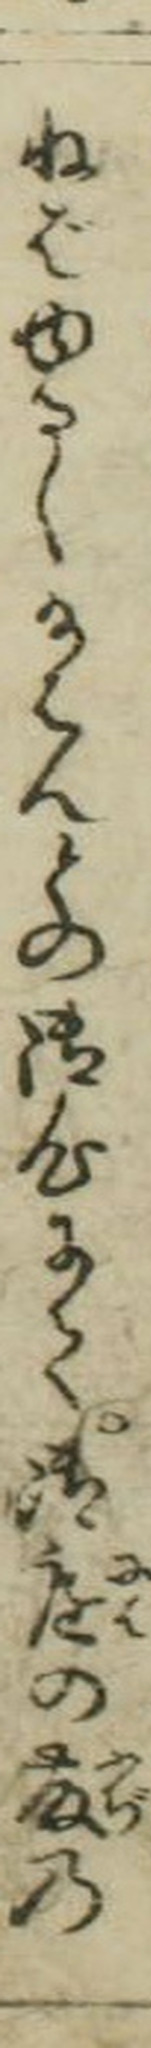ねばゆるし給はんとの御心にて。御庭の藤の
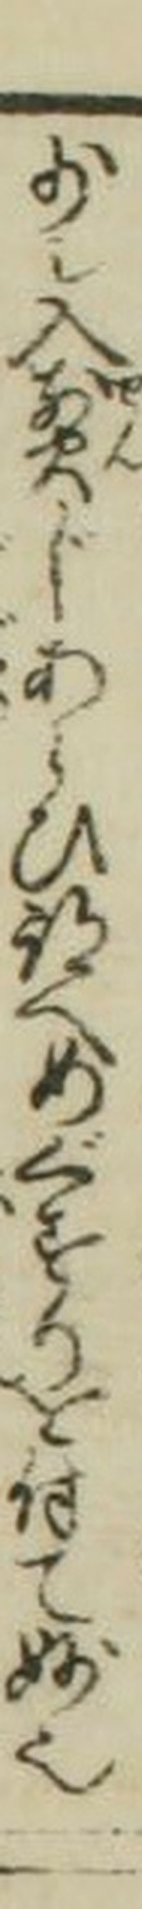少し入煎じあらひ跡へめぐすりを付て妙也
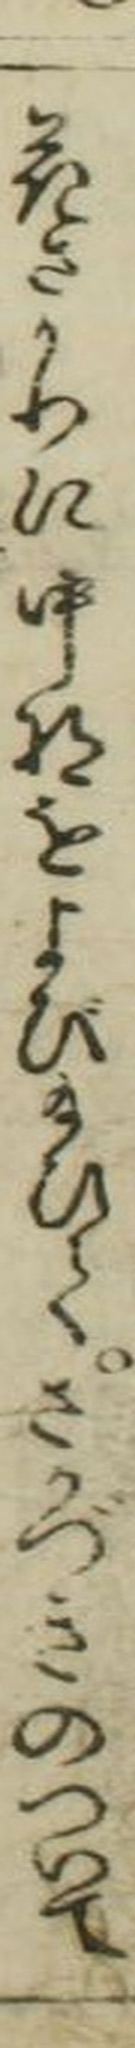花さかりに中将をよび給ひて。さかづきのついて
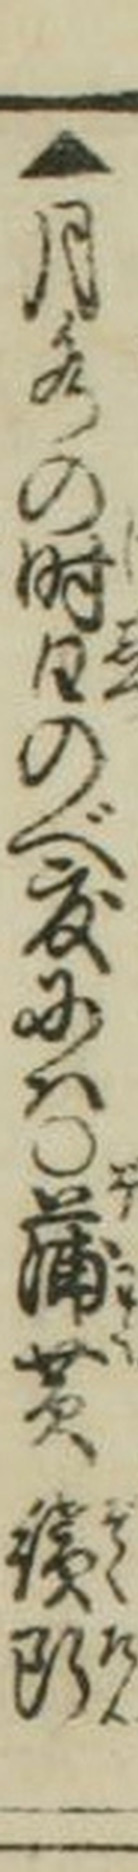▲月水の時日のべ度には◯蒲黄続断
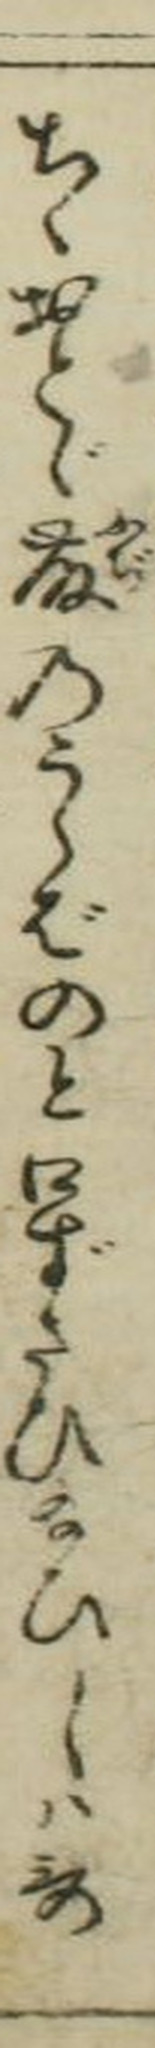ちゝおとゞ藤のうらばのと口ずさひ給ひしは哥
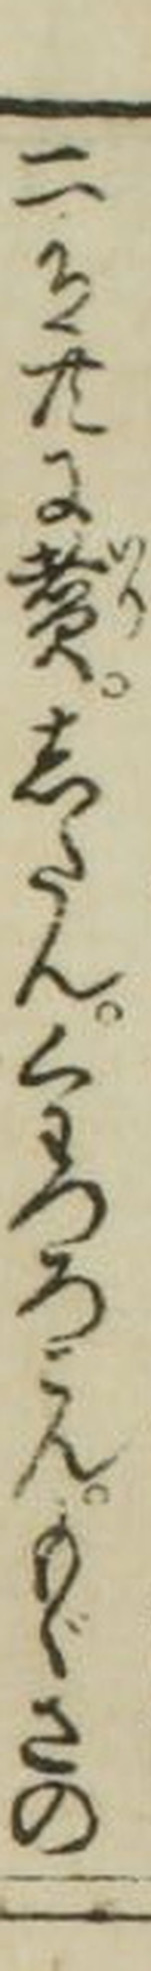二色共に煮。したん。くわつろこん。もぐさの
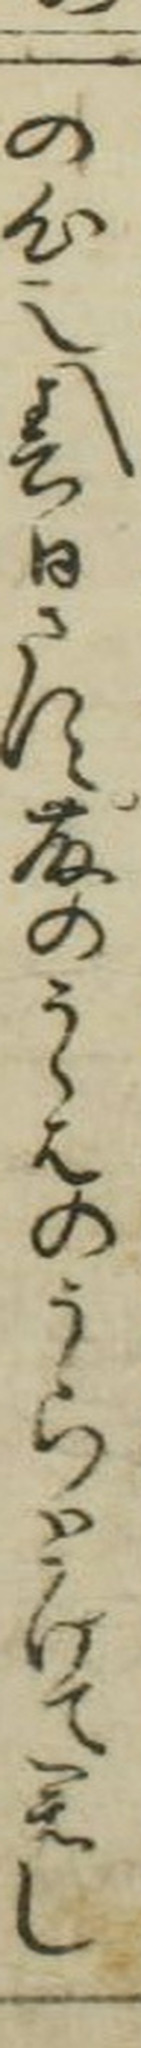の心也〽春日さす藤のうらはのうらとけて君し
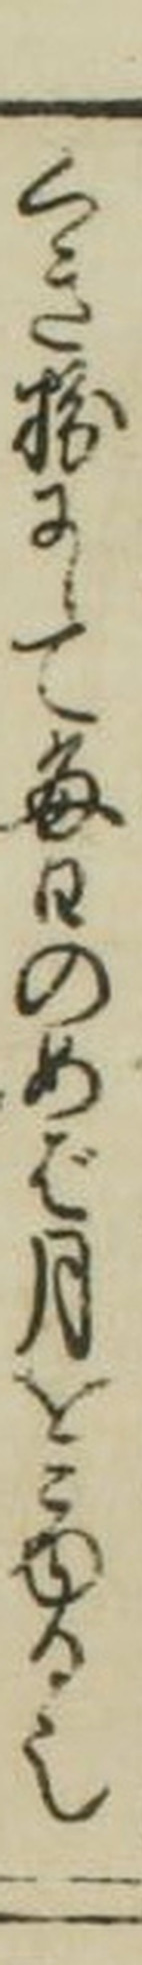くき粉にして毎日のめば月をこゆる也
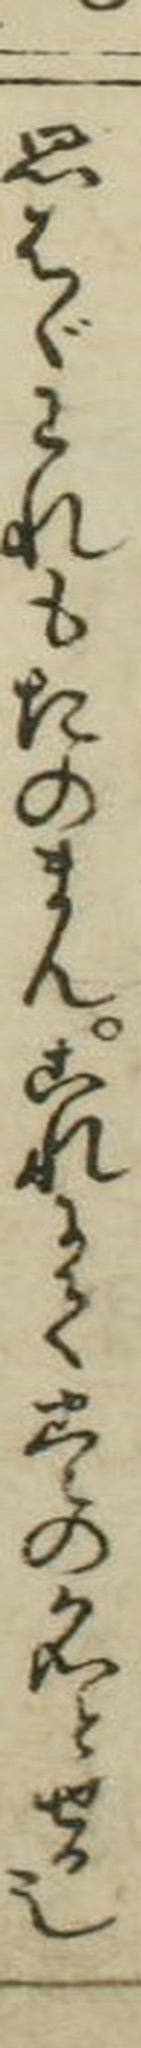思はゞわれもたのまん。これにて巻の名とせる也
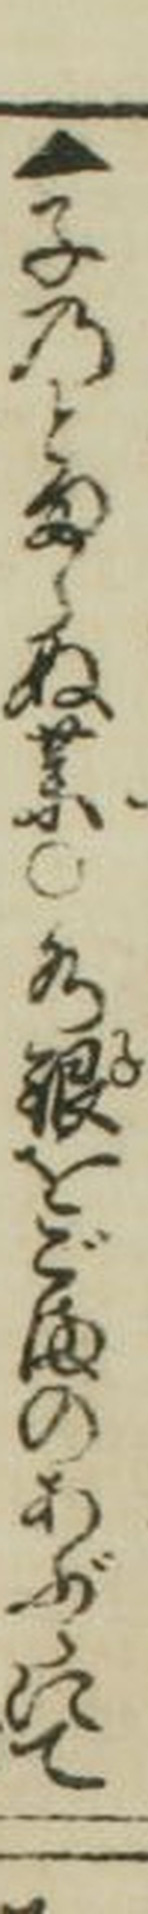▲子のとまらぬ薬◯水銀をごまのあぶらにて
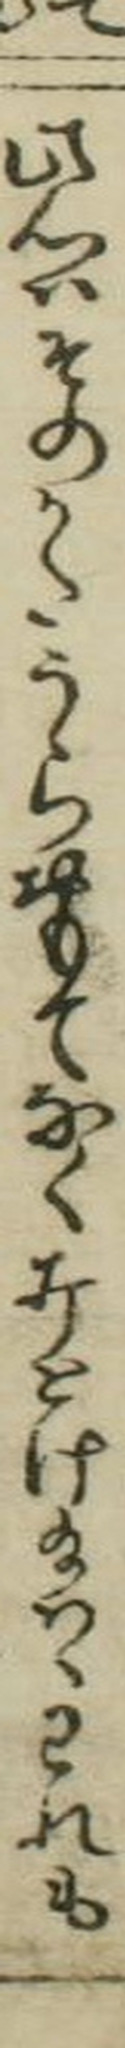此心はそのかたうらおもてなく打とけ給はゝわれも
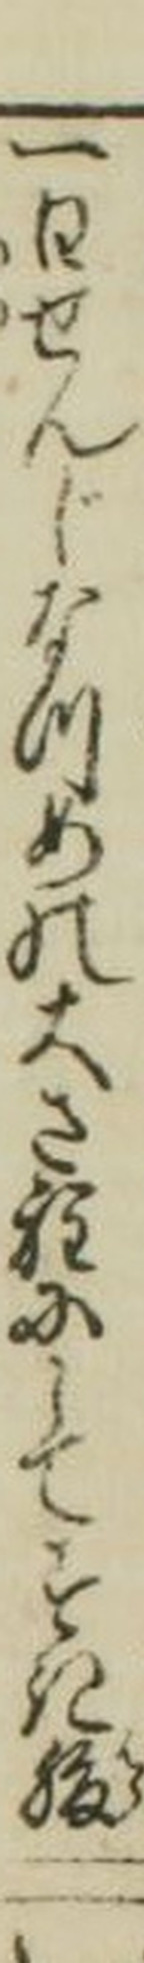一日せんじなつめの大さ程にしてすき腹
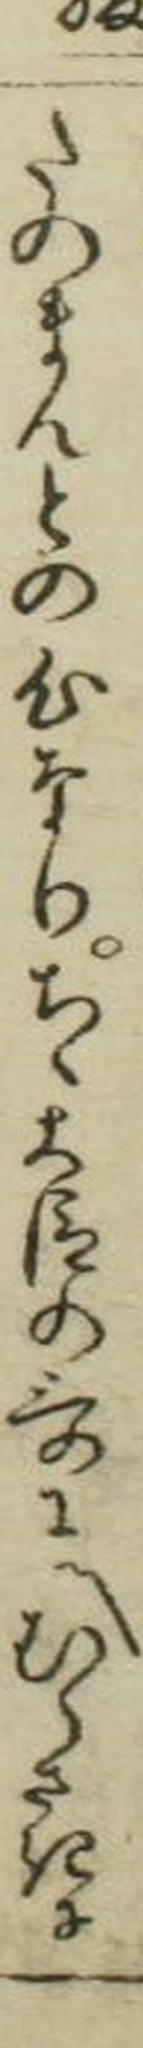たのまんとの心なり。ちゝ大臣の哥に〽むらさきに
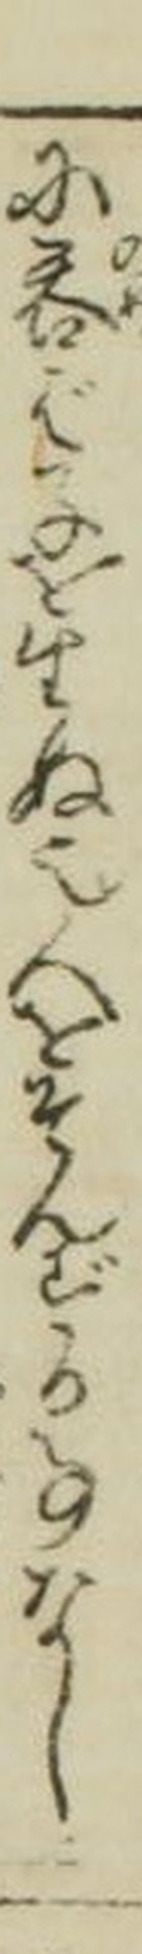に呑ば子を生ぬ也人をそんずる事なし
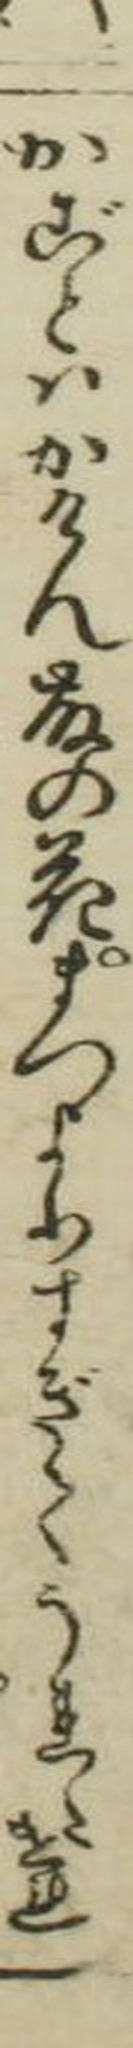かごとはかけん藤の花。まつよりすぎてうれたけれ
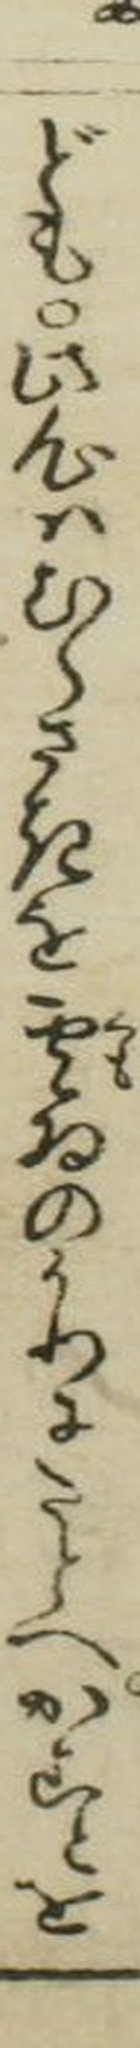ども◯此心はむらさきを雲ゐのかりにたとへ。かことを
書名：女源氏教訓鑑
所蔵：東京学芸大学附属図書館
